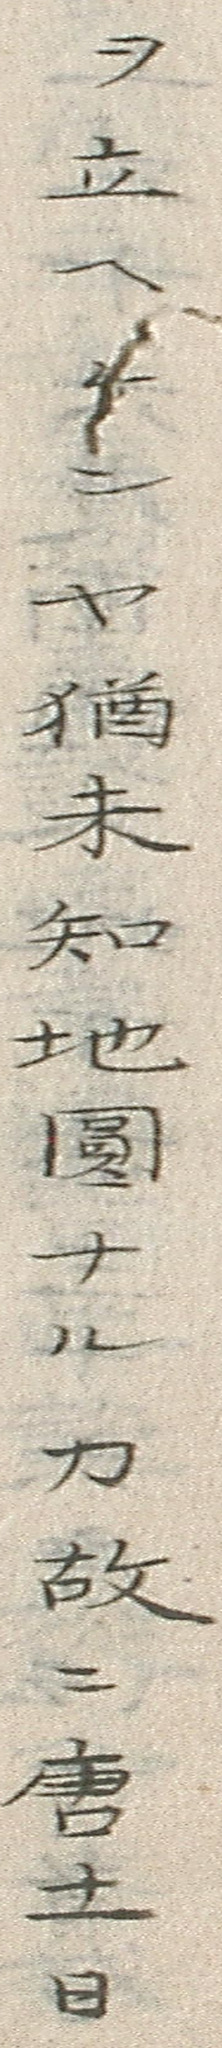ヲ立ヘケンヤ猶未知地円ナルカ故ニ唐土日
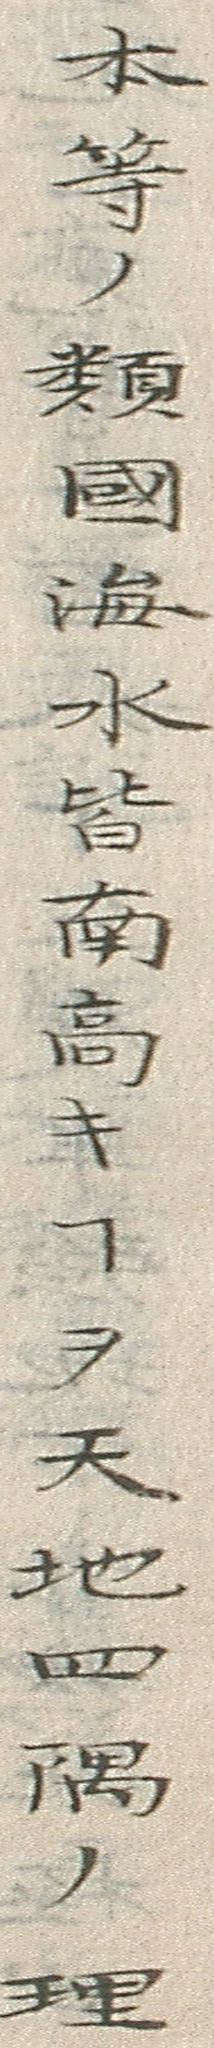本等ノ類国海水皆南高キコトヲ天地四ン隅ノ理
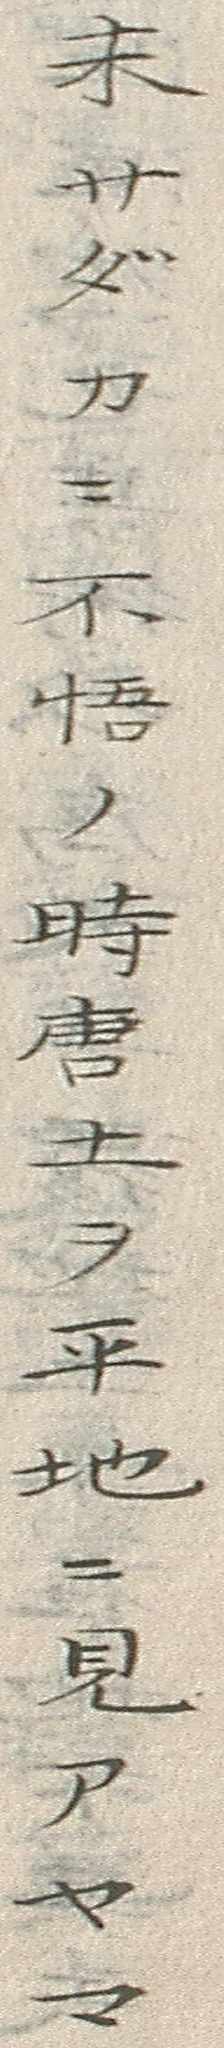未サダカニ不悟ノ時唐土ヲ平地ニ見アヤマ
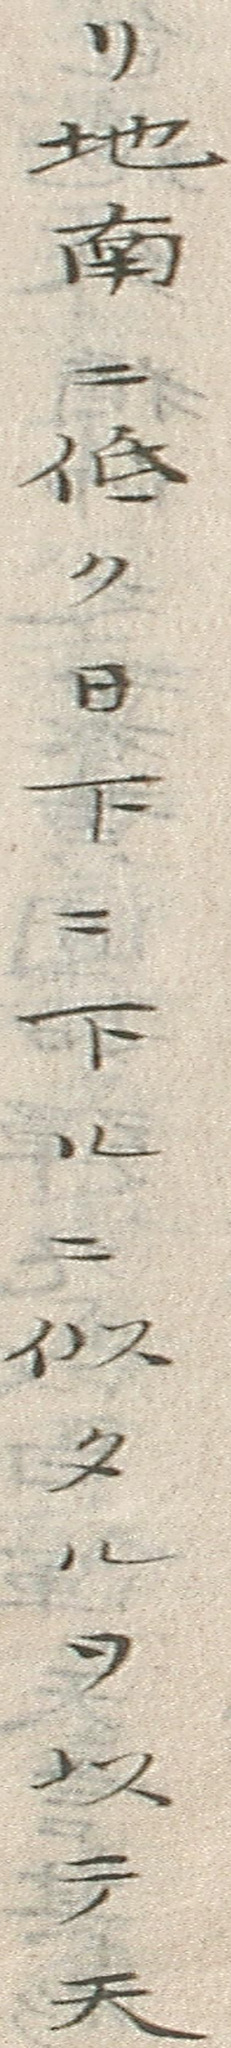リ地南ニ低ク日下ニ下ルニ似タルワ似テ天
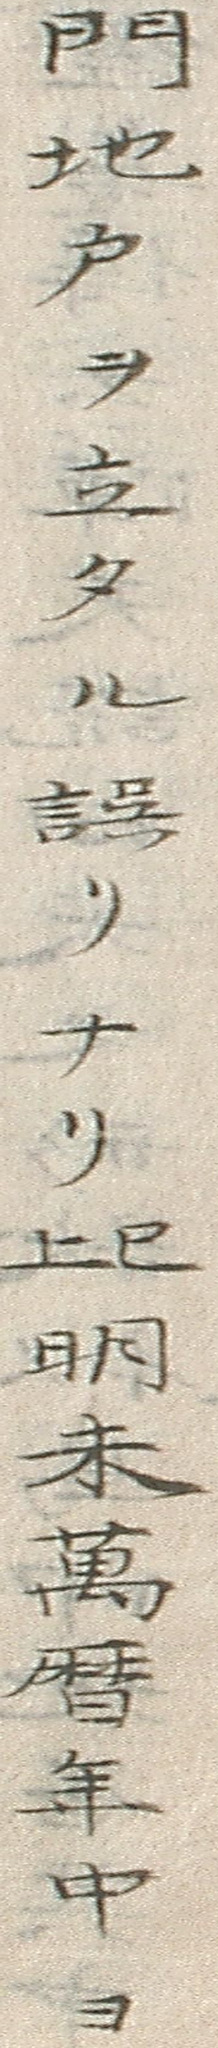門地戸ヲ立タル誤リナリ已上明未万暦年中ヨ
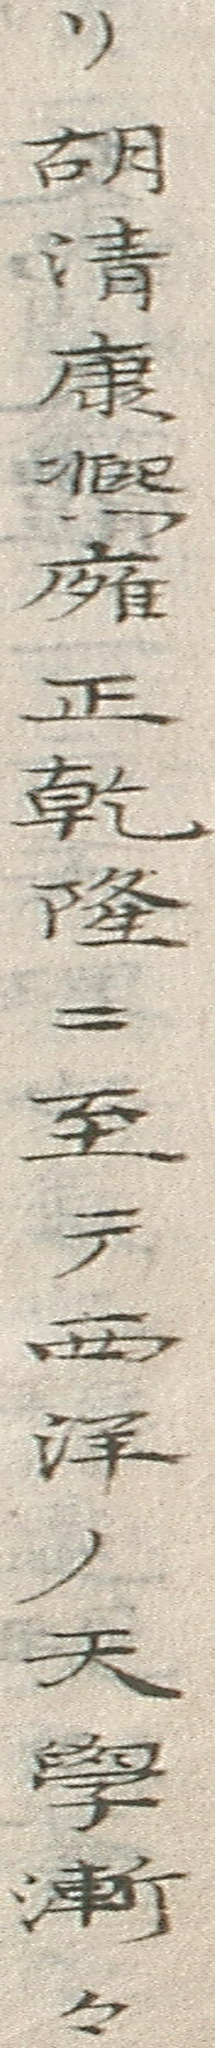リ胡清康熙雍正乾隆ニ至テ西洋ノ天学漸々
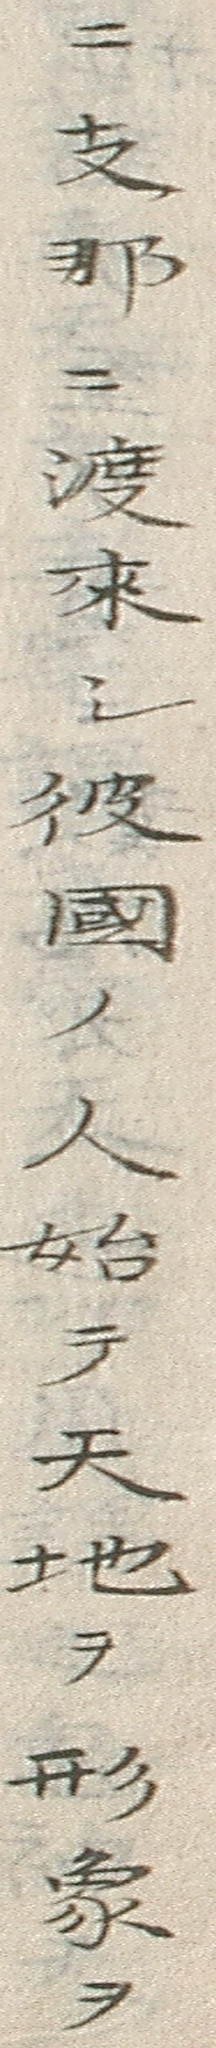ニ支那ニ渡来シ彼国ノ人始テ天地ヲ形象ヲ
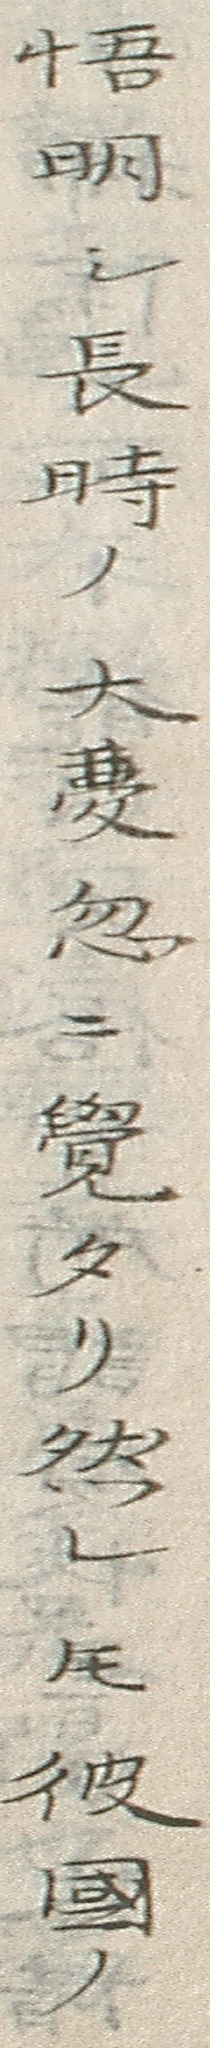悟明シ長時ノ大慶忽ニ覚タリ然レトモ彼国ノ
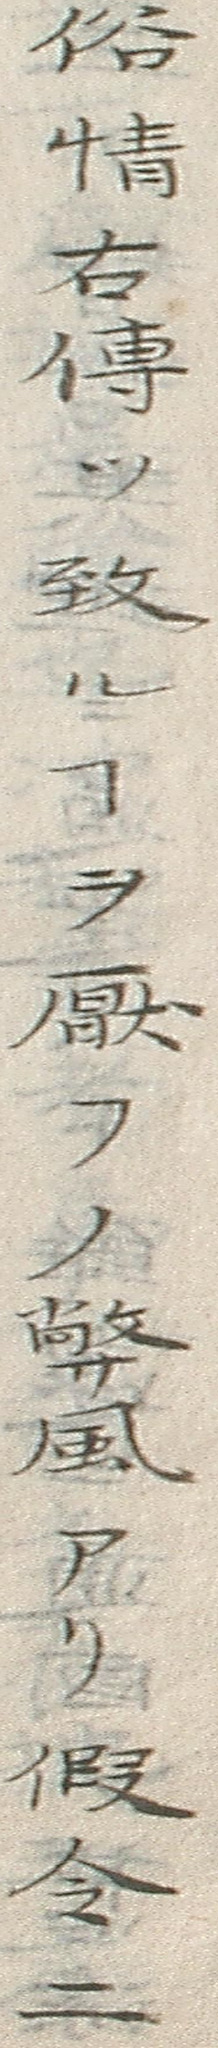俗情右伝ツ致ルコトヲ厭フノ弊風アリ仮令二

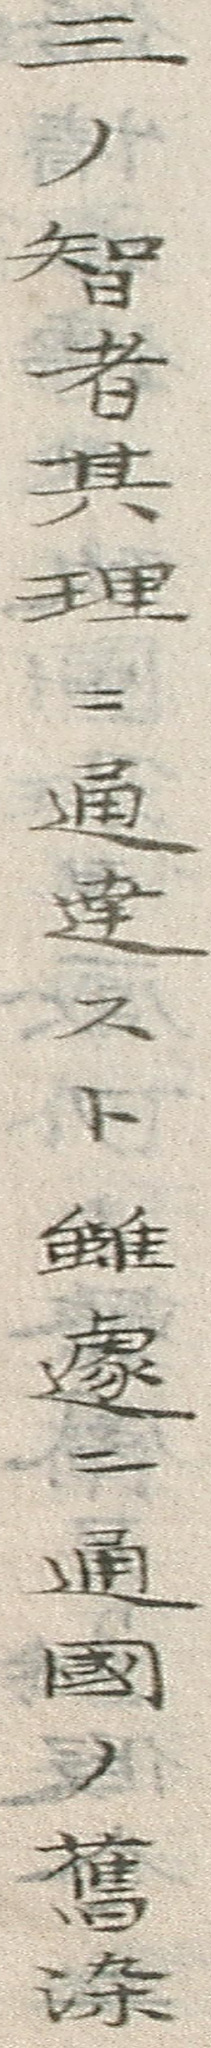三ノ智者其理ニ通達スト雖遽ニ通国ノ旧染
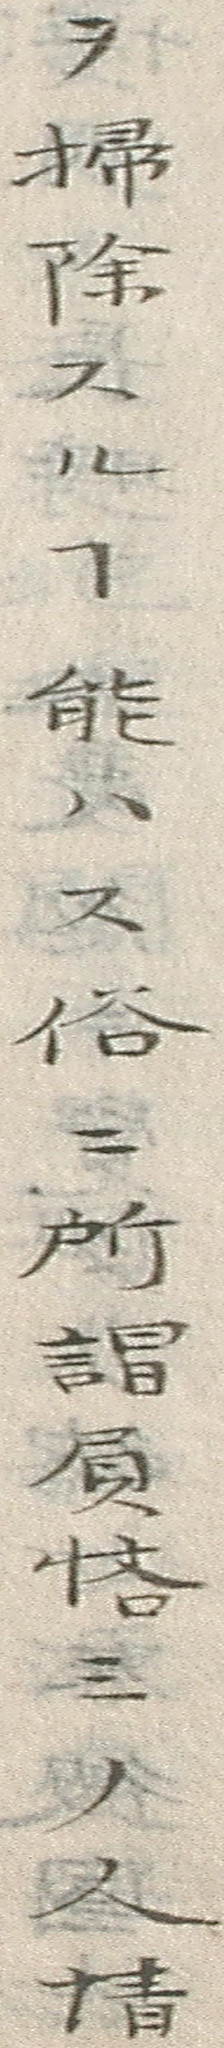ヲ掃除スルコト能ハズ俗ニ所謂屓悋ミノ人情
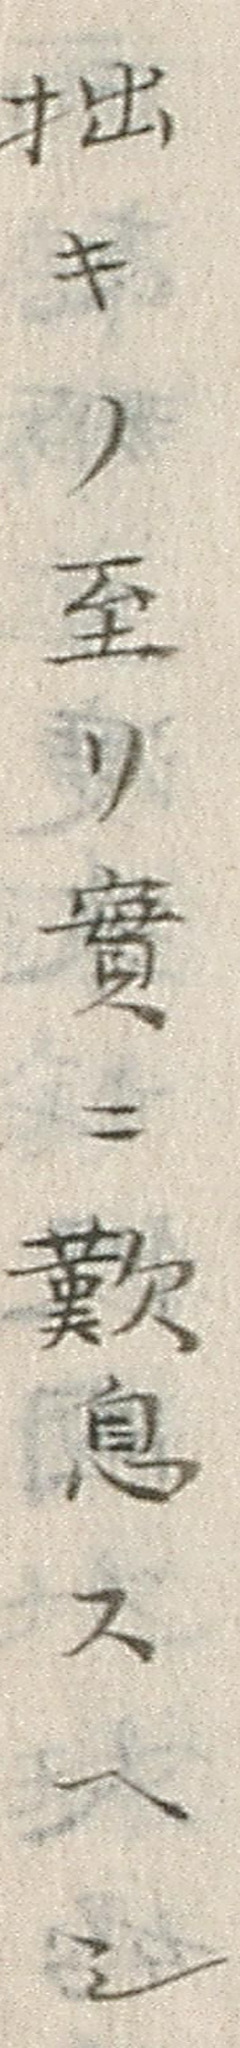拙キノ至リ実ニ歎息スヘシ
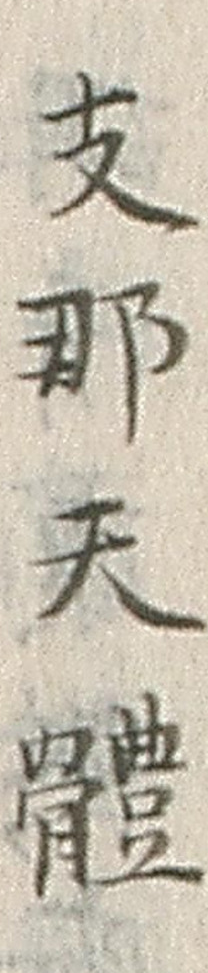支那天体
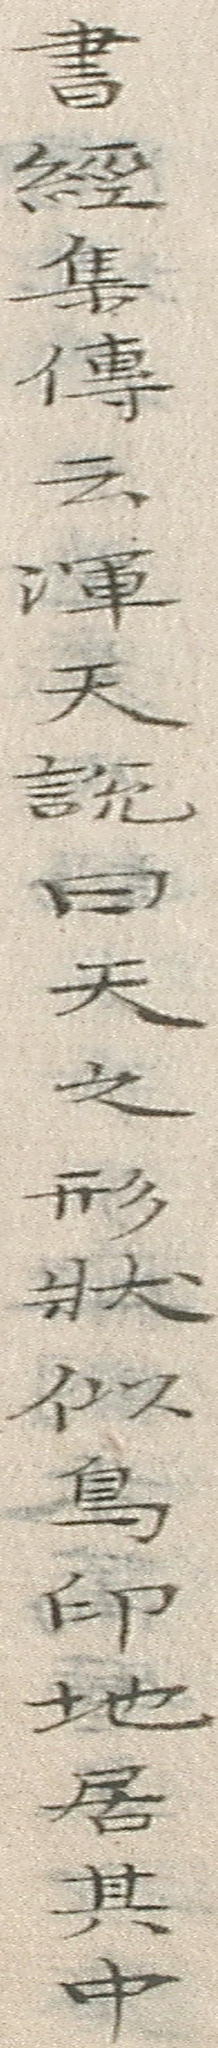書経集伝云渾天説曰天之形状似島印地居其中
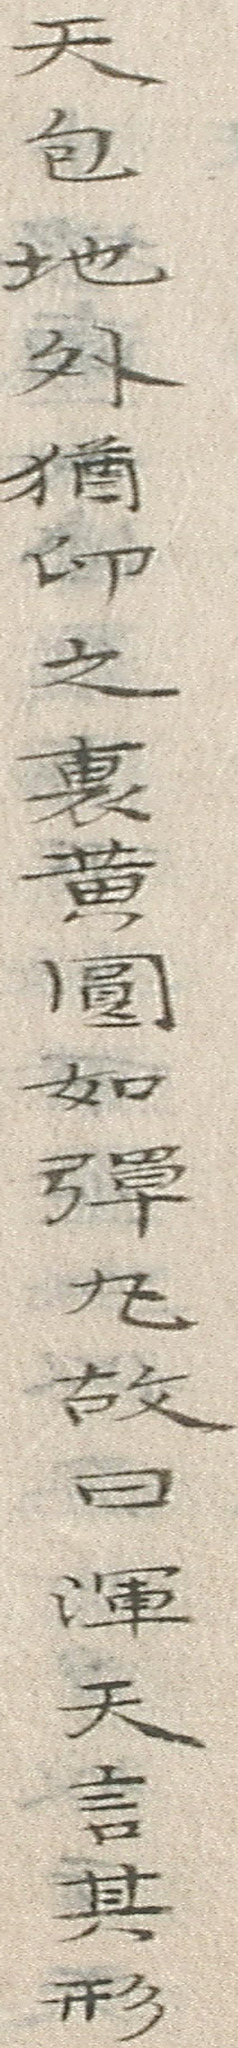天包地外猶印之裏黄円如弾丸故曰渾天言其形
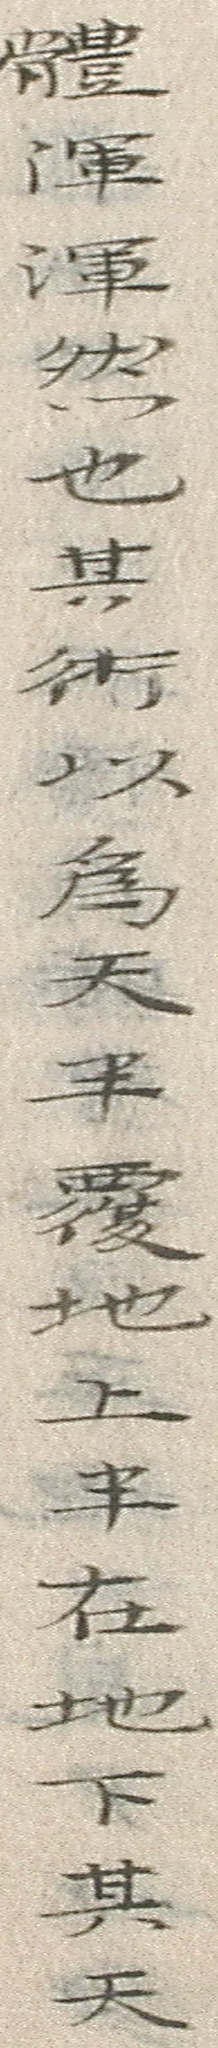体渾渾然也其術以為天半覆地上半在地下其天
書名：天學略名目羽翼　全
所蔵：東京大学地震研究所図書室 Earthquake Research Institute Library, The University of Tokyo, JAPAN
